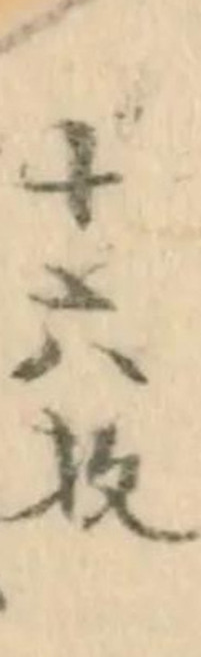十六枚
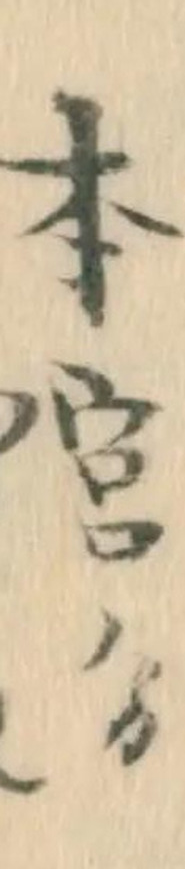本宮分
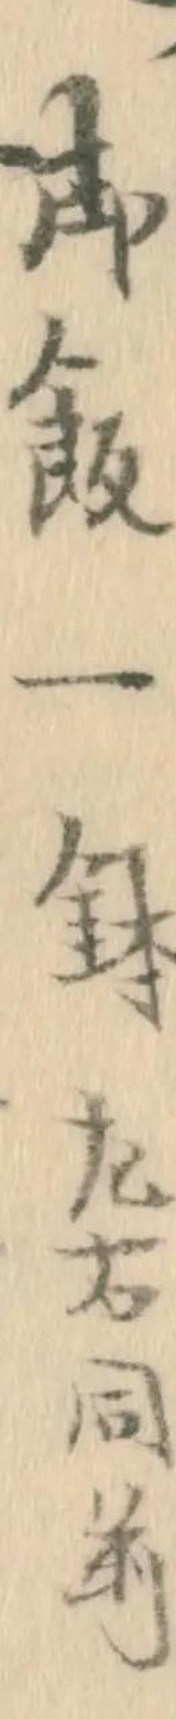御飯一鉢左右同前
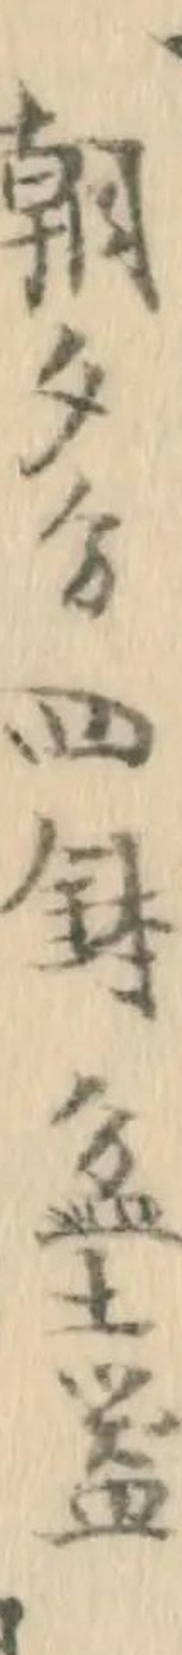朝夕分四鉢盆土器
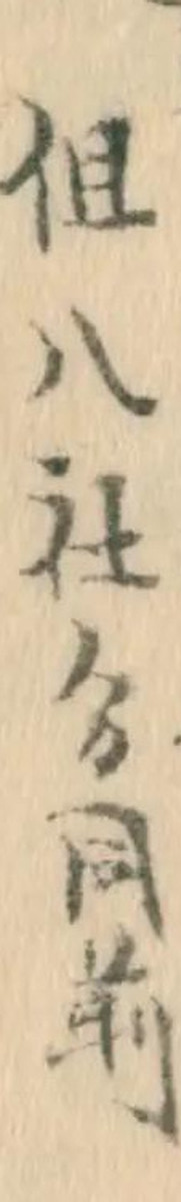但八社分同前
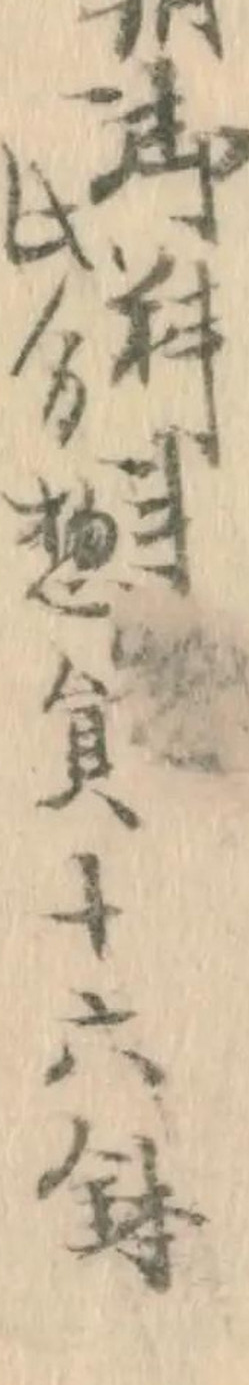此分惣員十六具
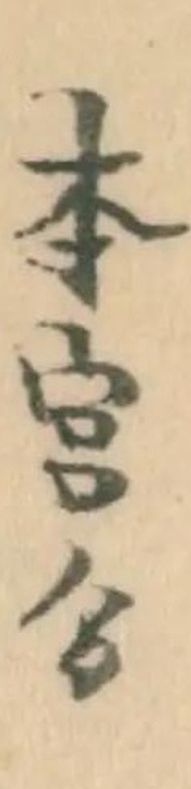本宮分
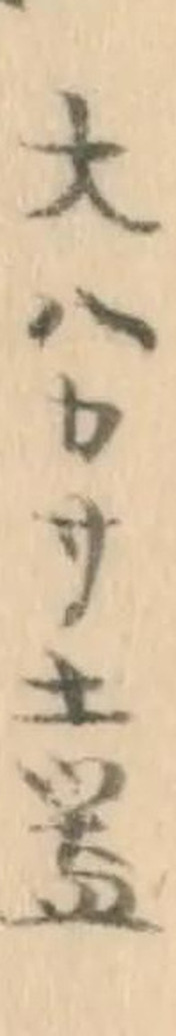大ハカサ土器
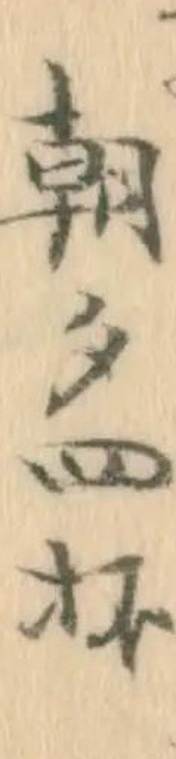朝夕四杯
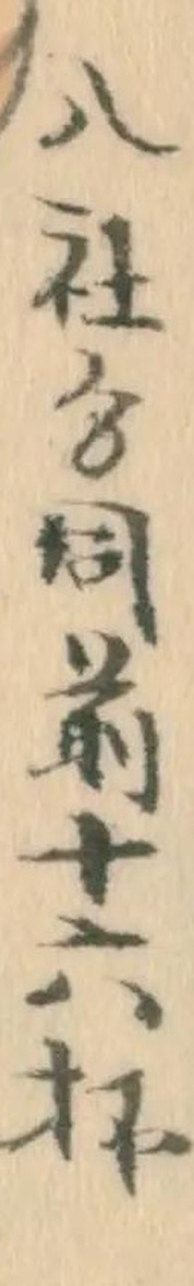八社分同前十六杯
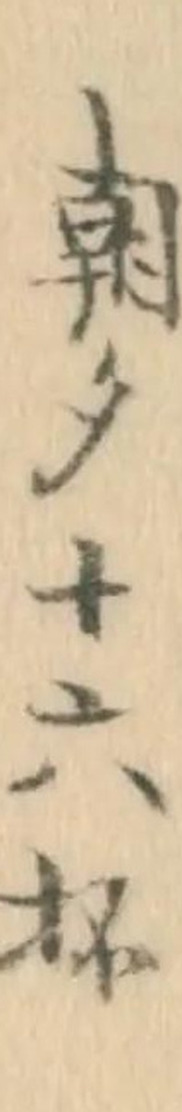朝夕十六杯
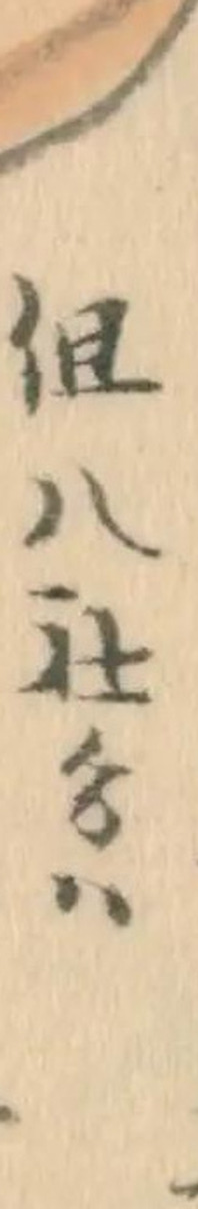但八社分ハ
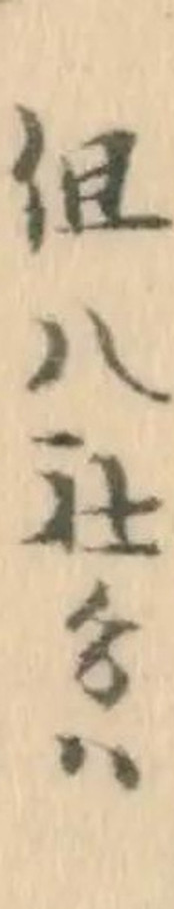但八社分ハ
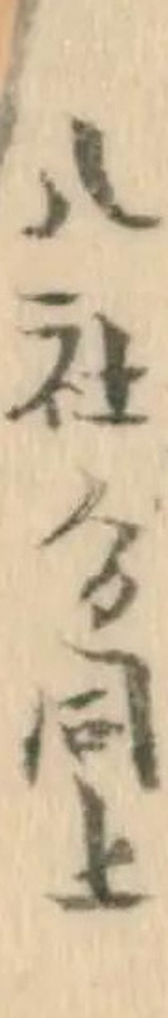八社分同上
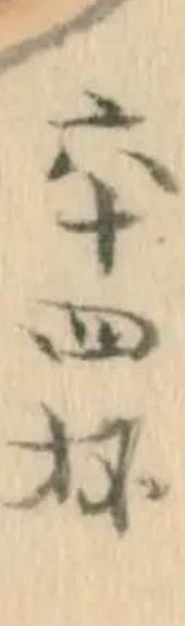六十四杯
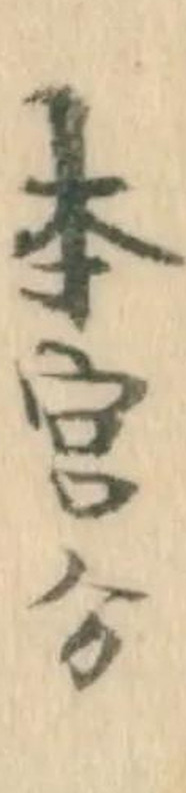本宮分
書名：葵御祭供進之神饌諸品色目書
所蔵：国立国会図書館 National Diet Library, JAPAN
